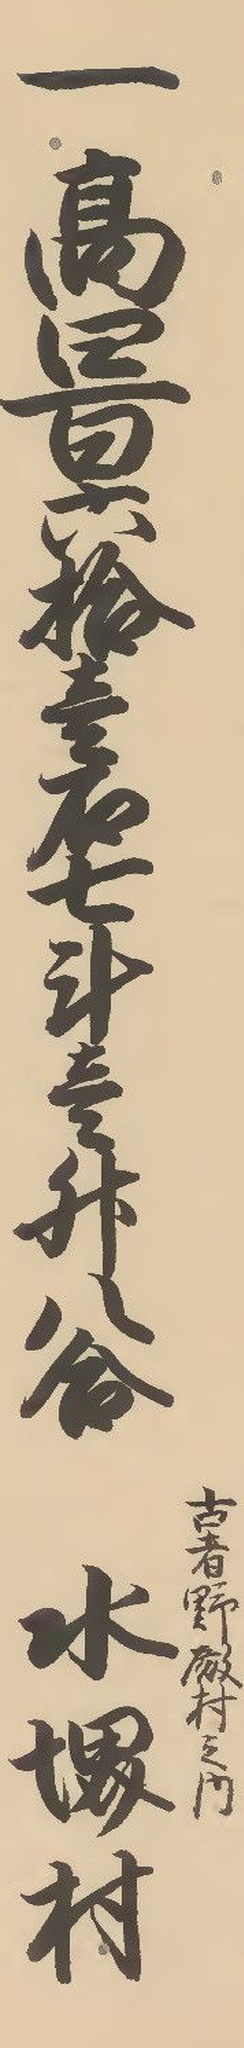一髙四百六拾壱石七斗壱升八合水堺村
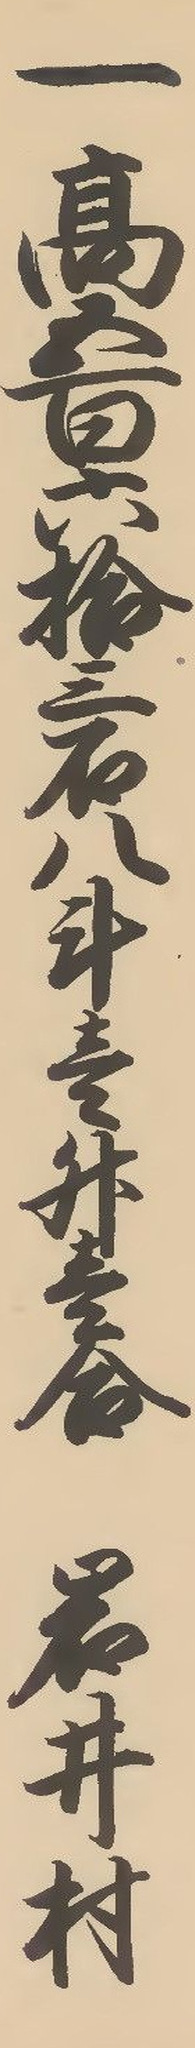一髙五百六拾三石八斗壱升壱合岩井村
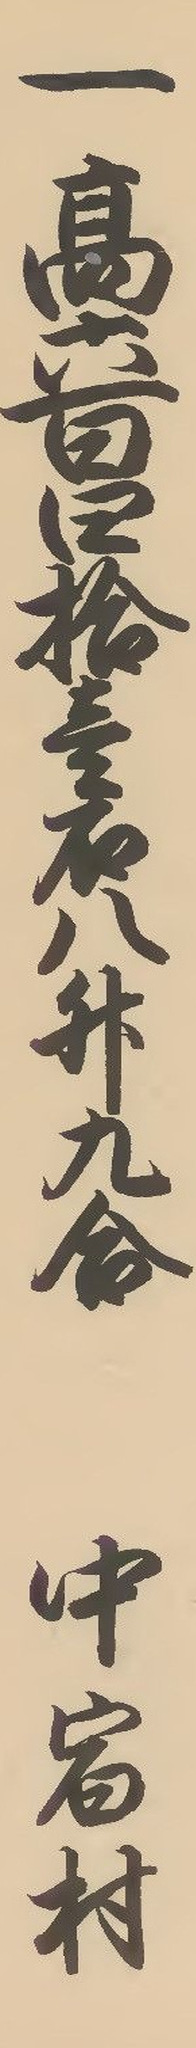一髙六百四拾壱石八升九合中宿村

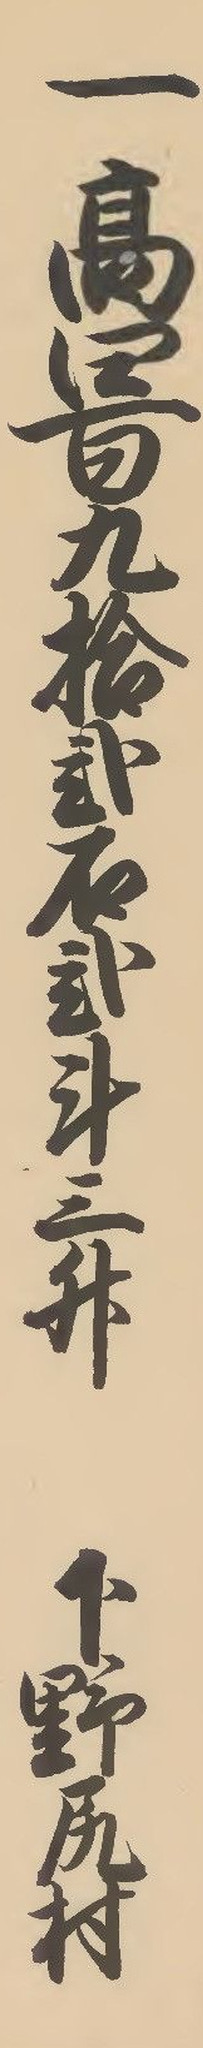一髙四百九拾弐石弐斗三升下野尻村
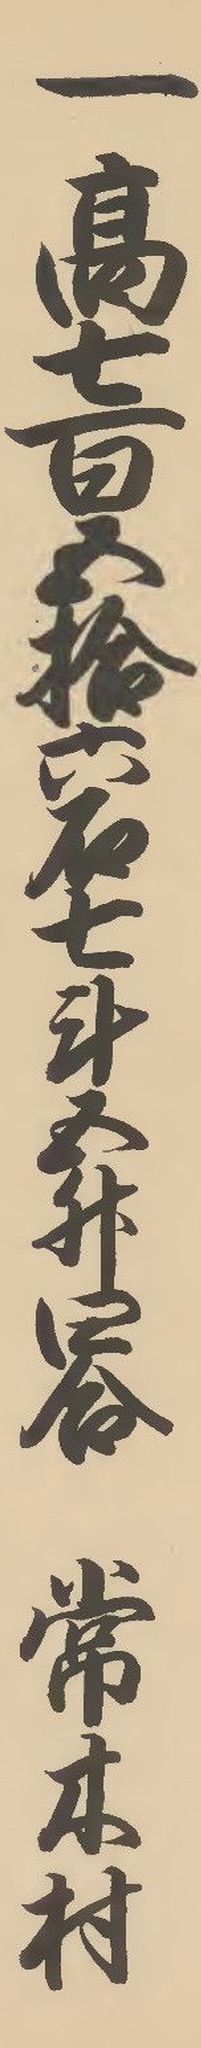一髙七百五拾六石七斗五升四合常木村
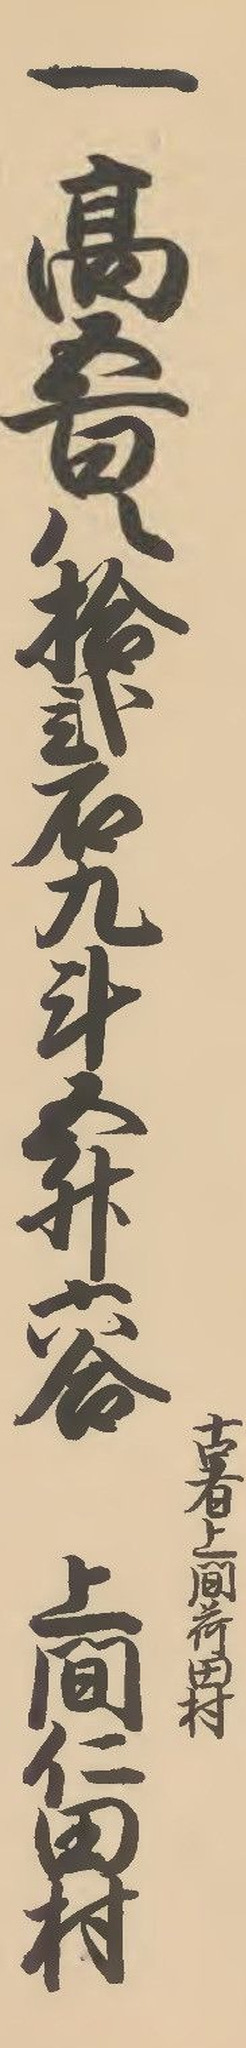一髙五百八拾弐石九斗五升六合上間仁田村
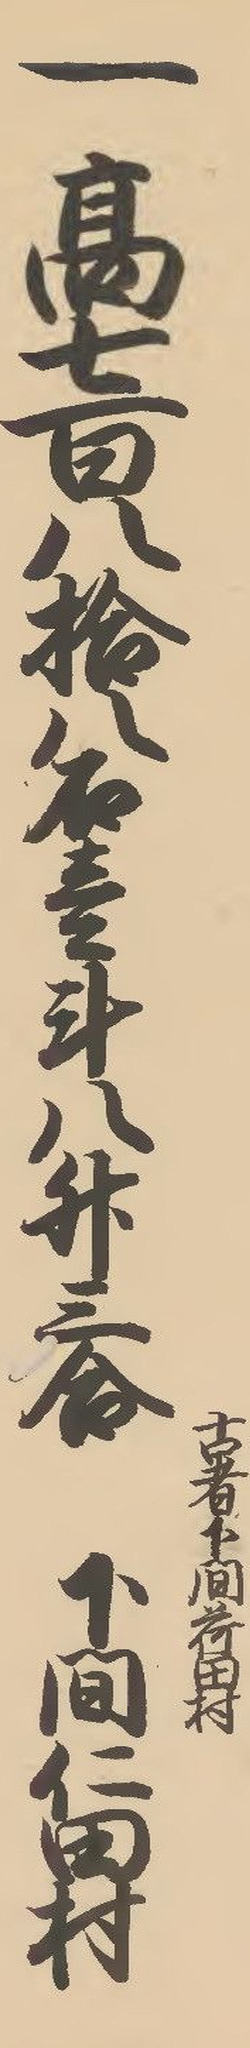一髙七百八拾八石壱斗八升三合下間仁田村
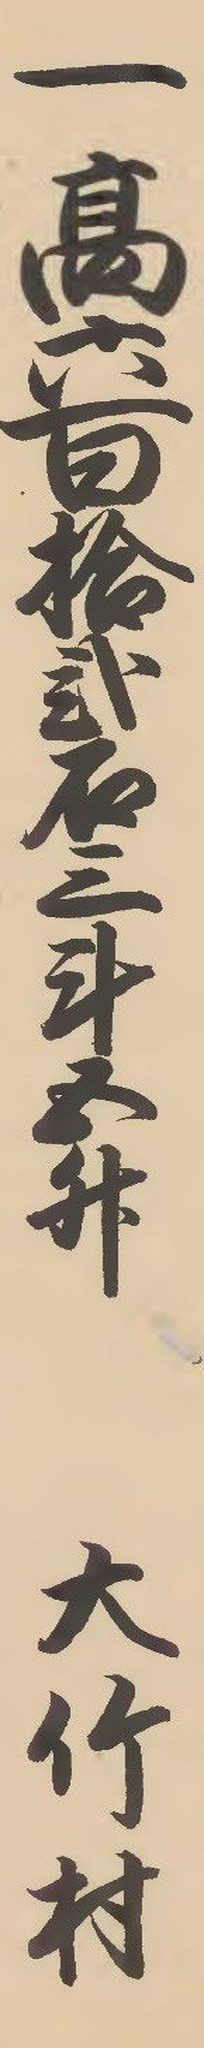一髙六百拾弐石三斗五升大竹村
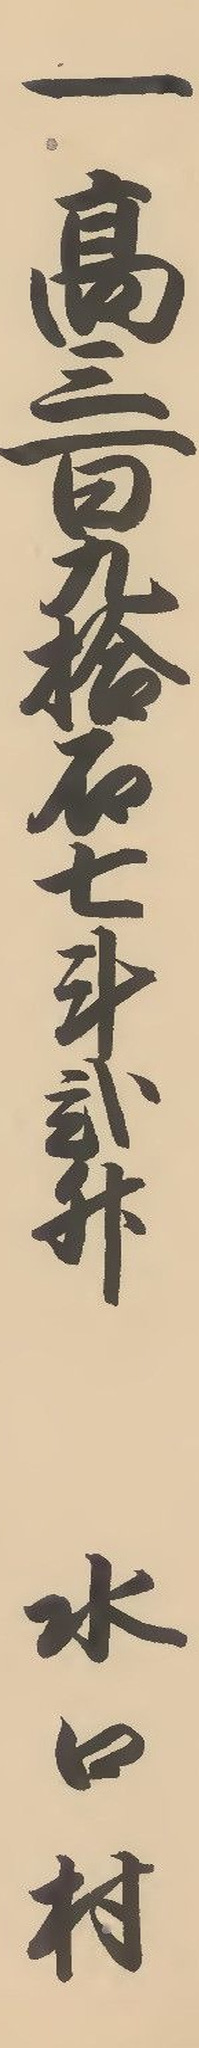一髙三百九拾石七斗弐升水口村
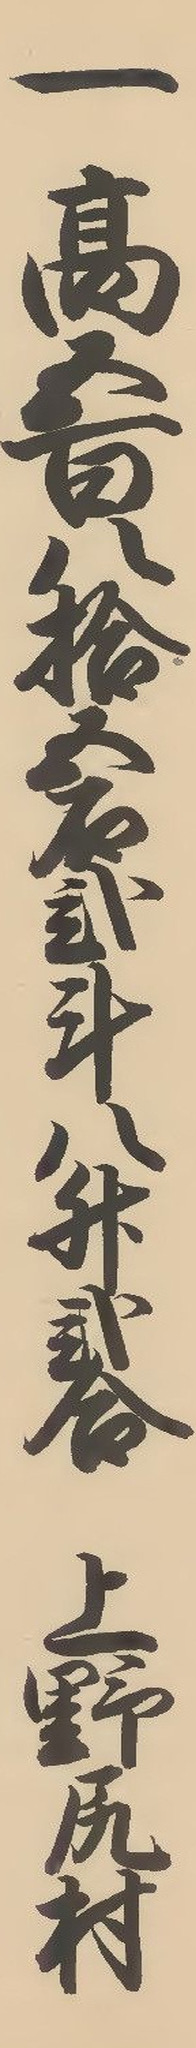一髙五百八拾五石弐斗八升弐合上野尻村
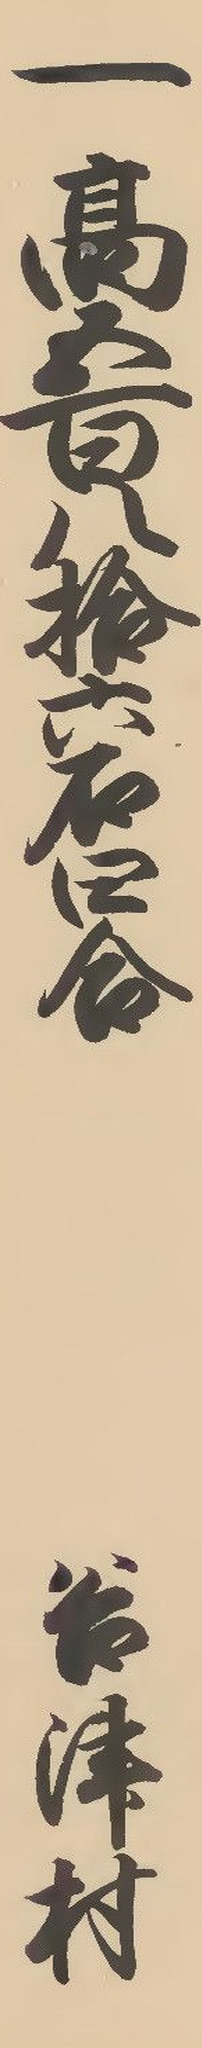一髙五百八拾六石四合谷津村

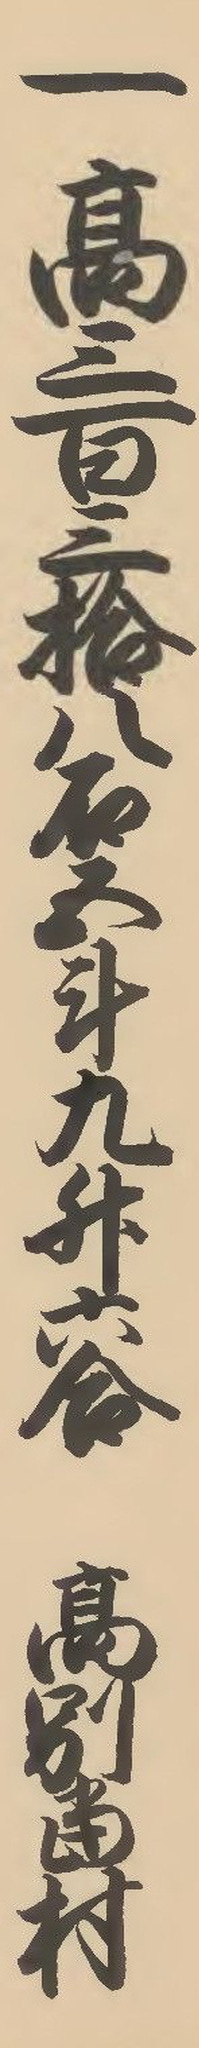一髙三百三拾八石五斗九升六合髙別当村
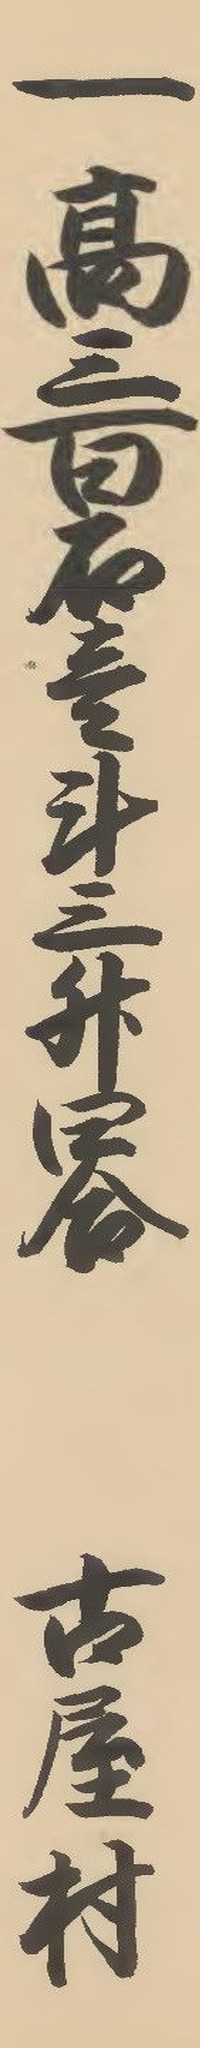一髙三百石壱斗三升四合古屋村
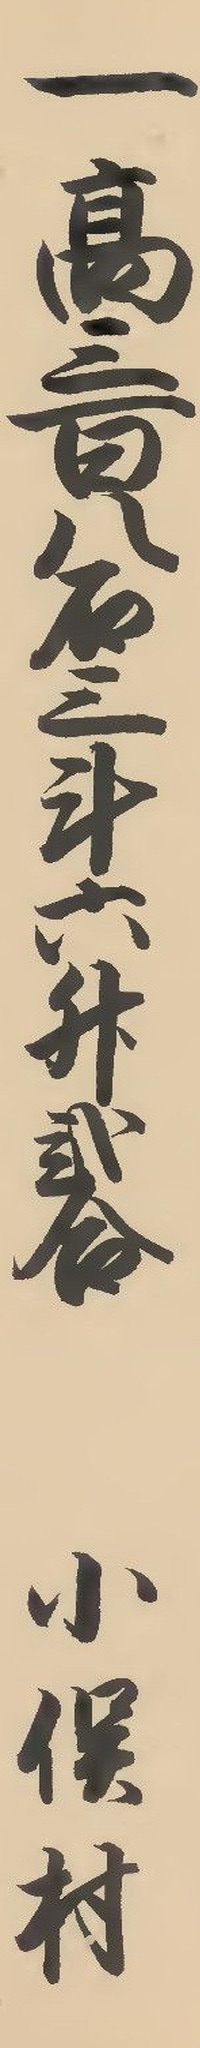一髙三百八石三斗六升弐合小俣村
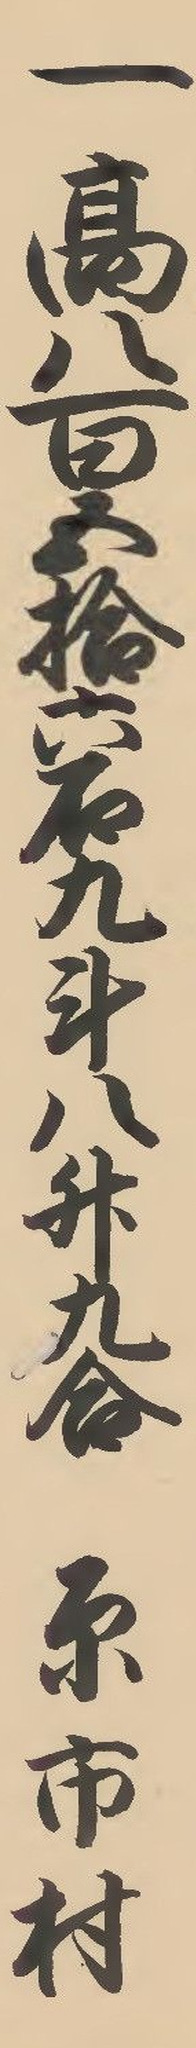一髙八百五拾六石九斗八升九合原市村
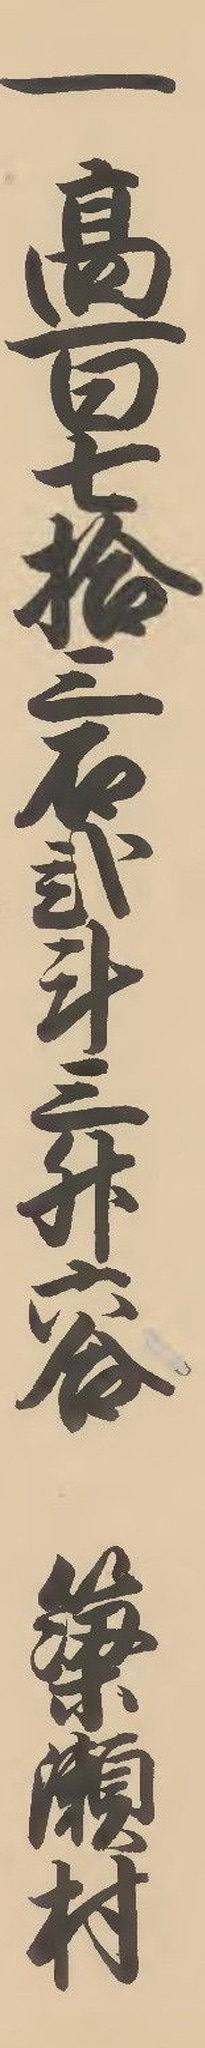一髙百七拾三石弐斗三升六合簗瀬村
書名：上野国郷帳
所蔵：国立公文書館 National Archives of Japan
